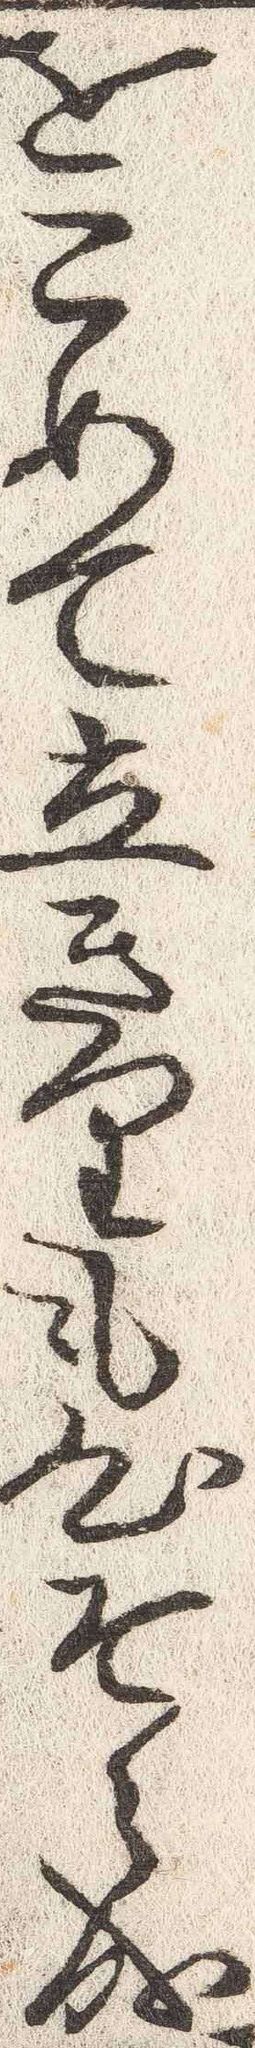をこめて立きりも心そら成
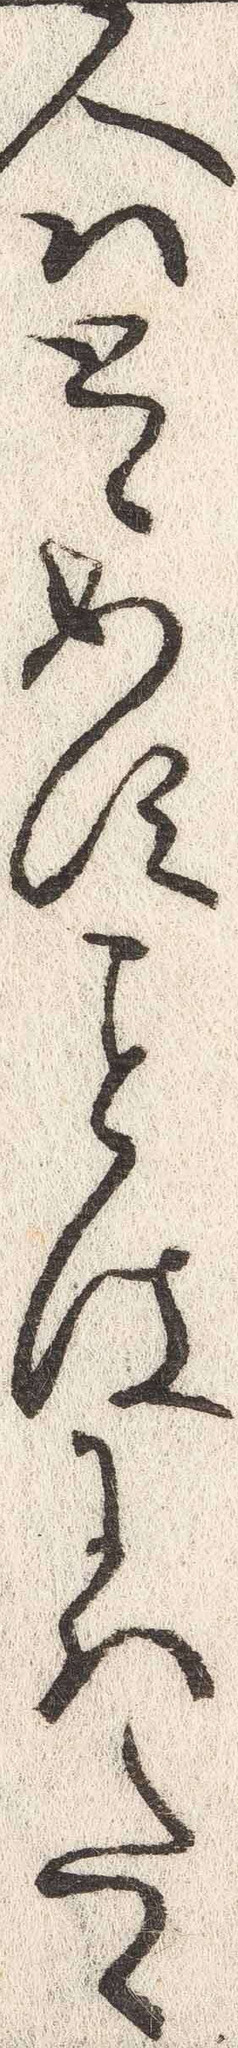人はとゝめすことはにはたゝ
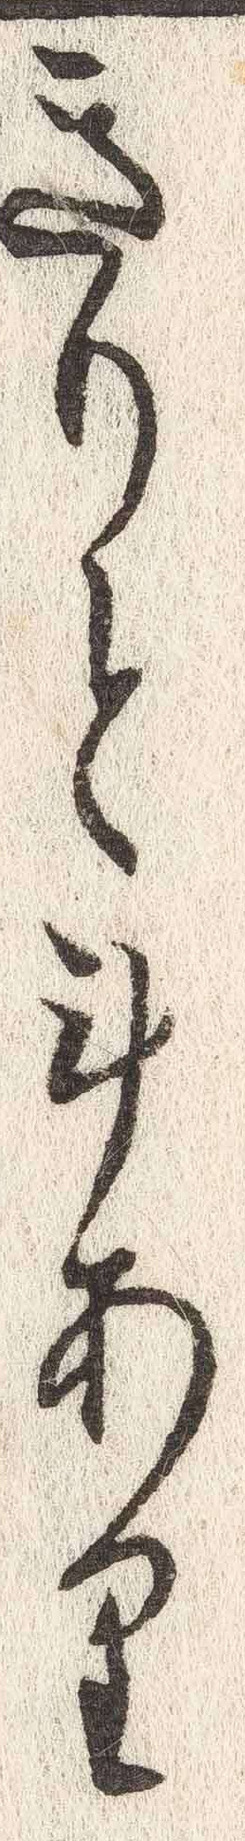きりと計あり
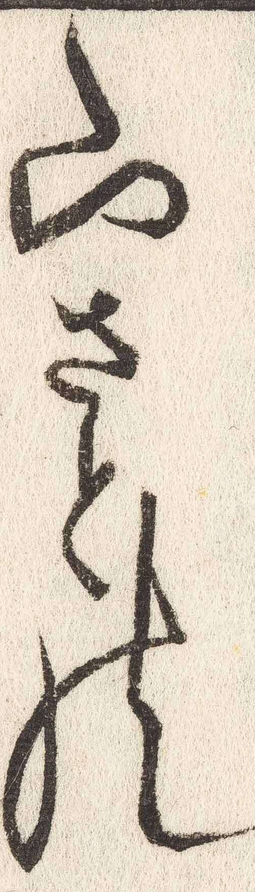山さとの
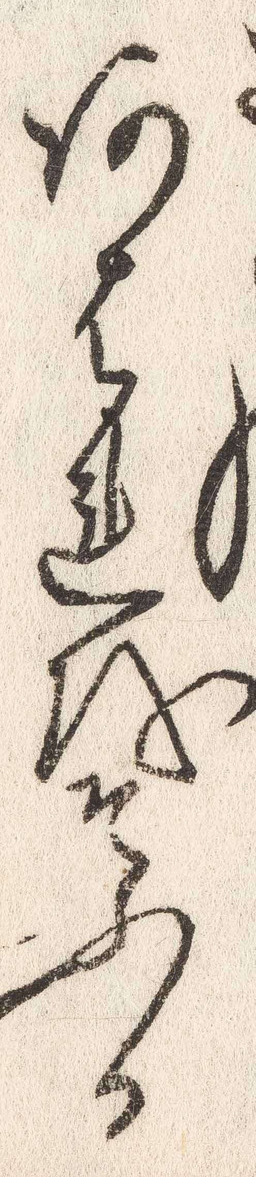あはれをそふる
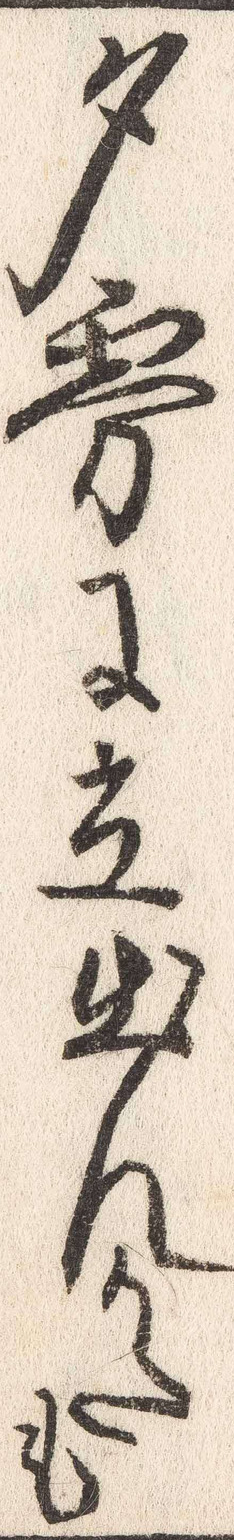夕霧に立出んかたも
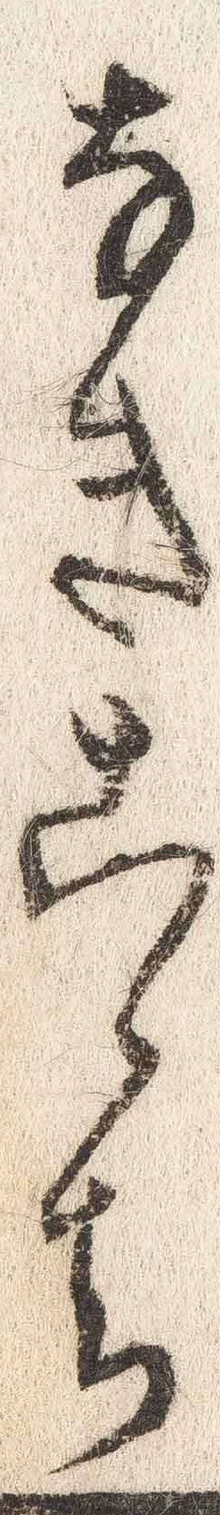なきこゝち

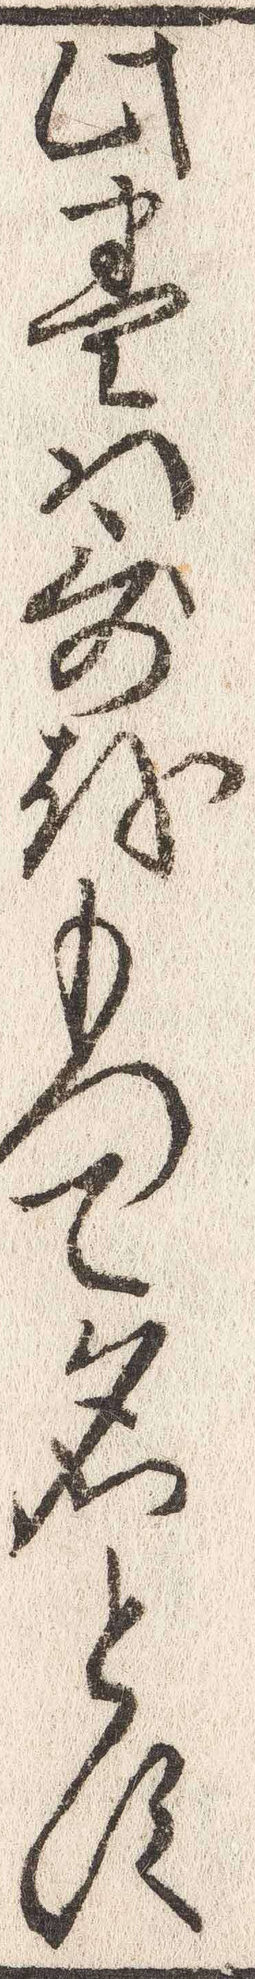此巻は哥をもつて名とす
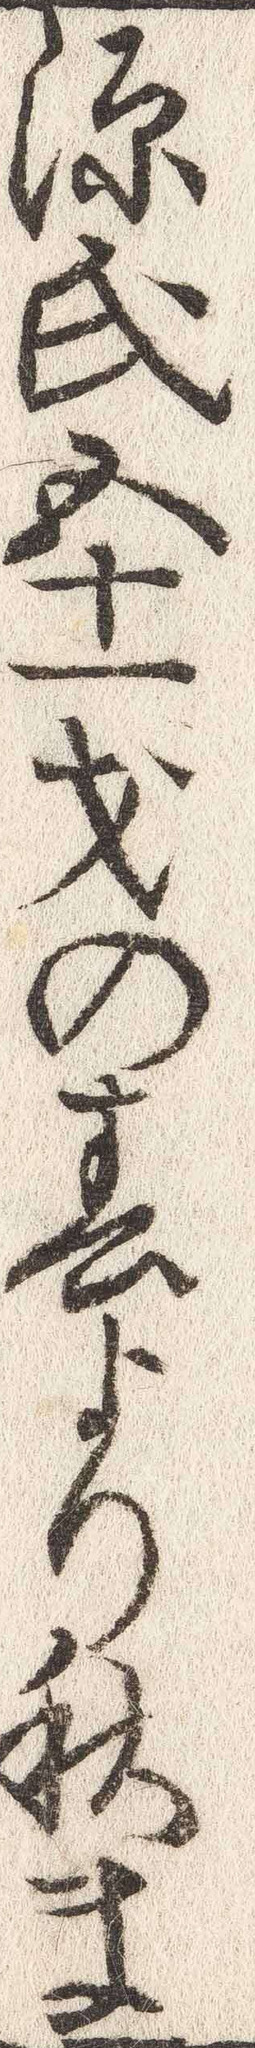源氏五十一才の春より秋ま
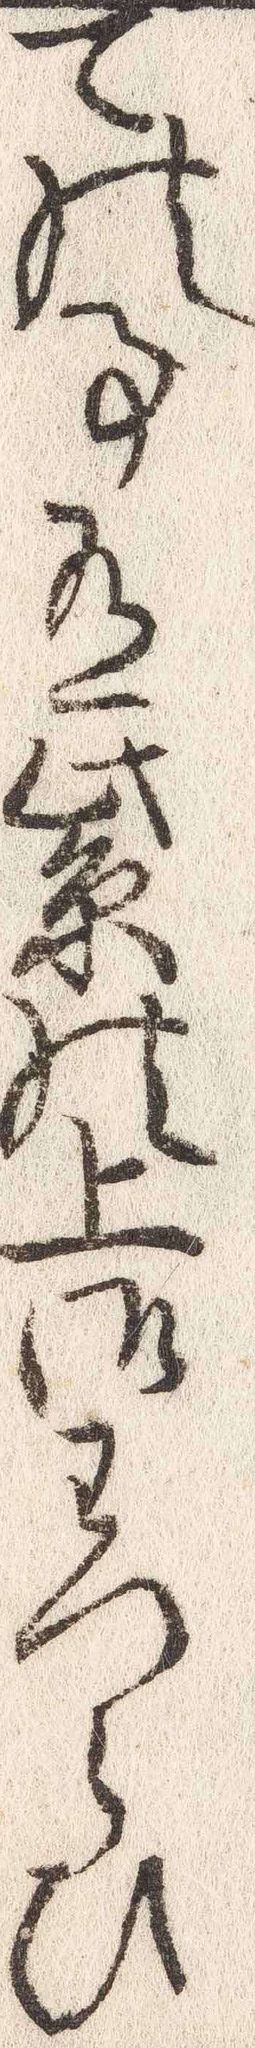ての事有紫の上御わつらひ
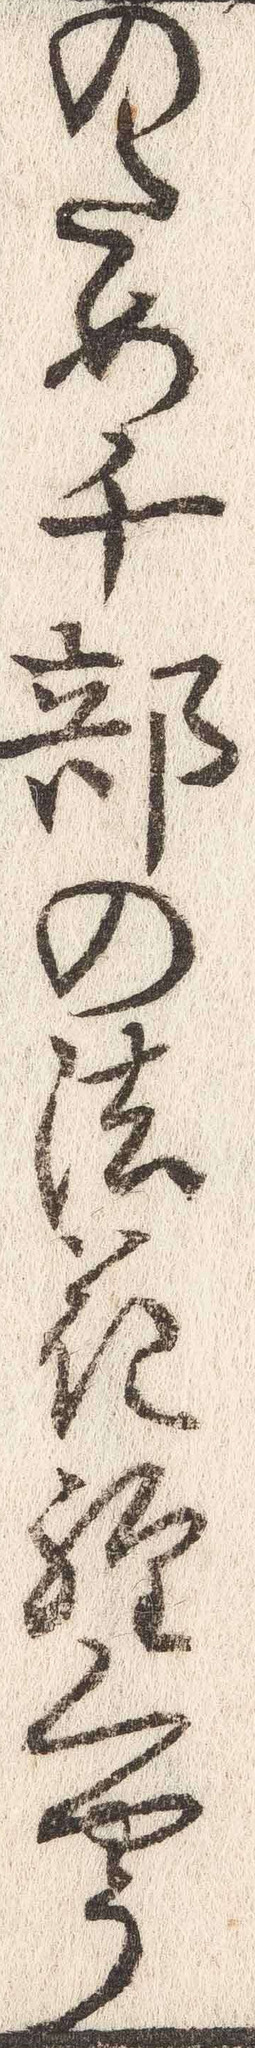のため千部の法花経くやう
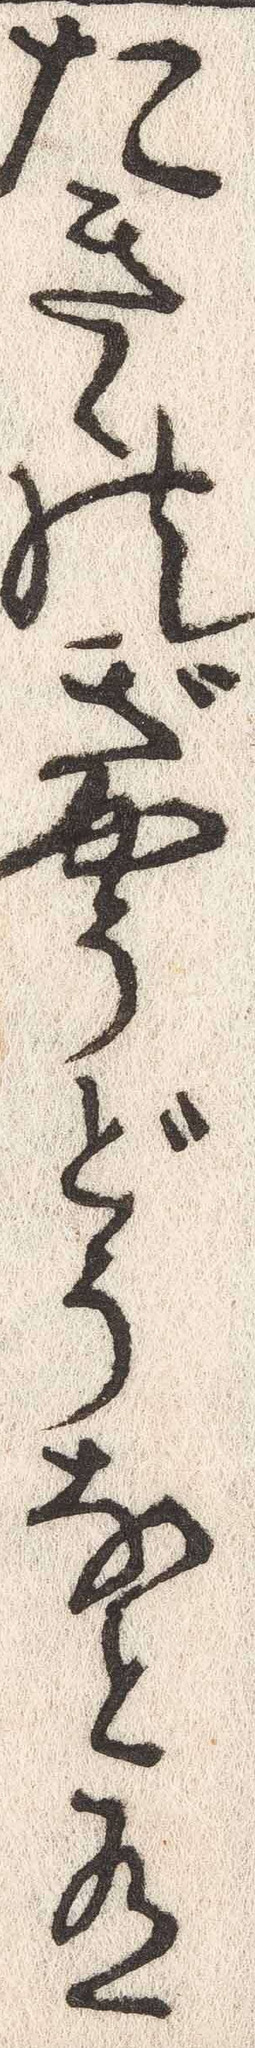たきゝのぎやうどうなと有
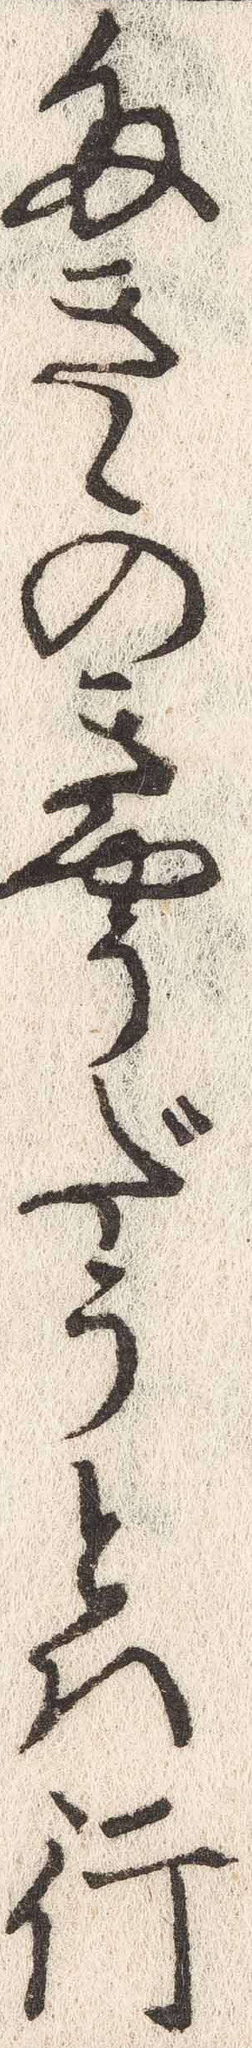たきゝのきやうだうとは行
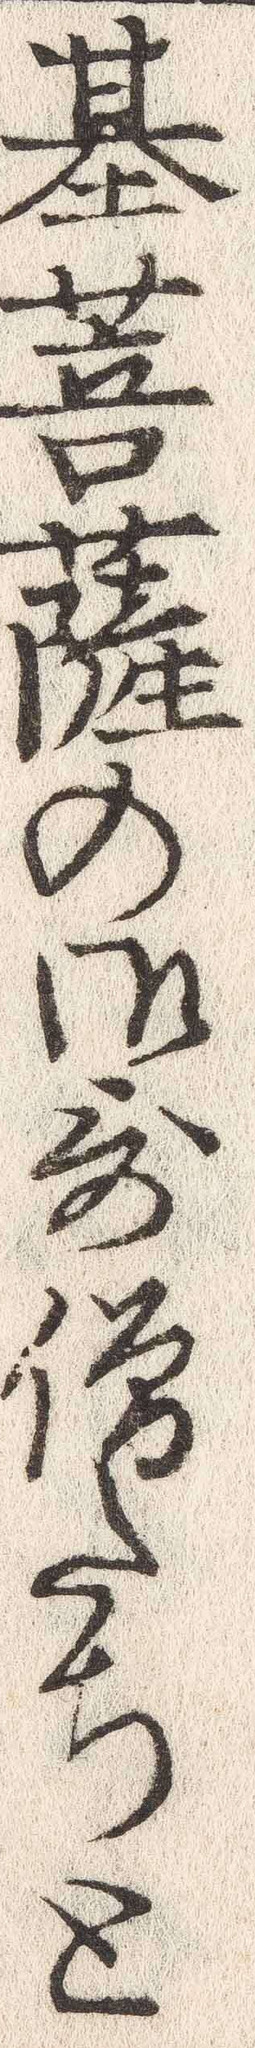基菩薩の御哥僧たちと
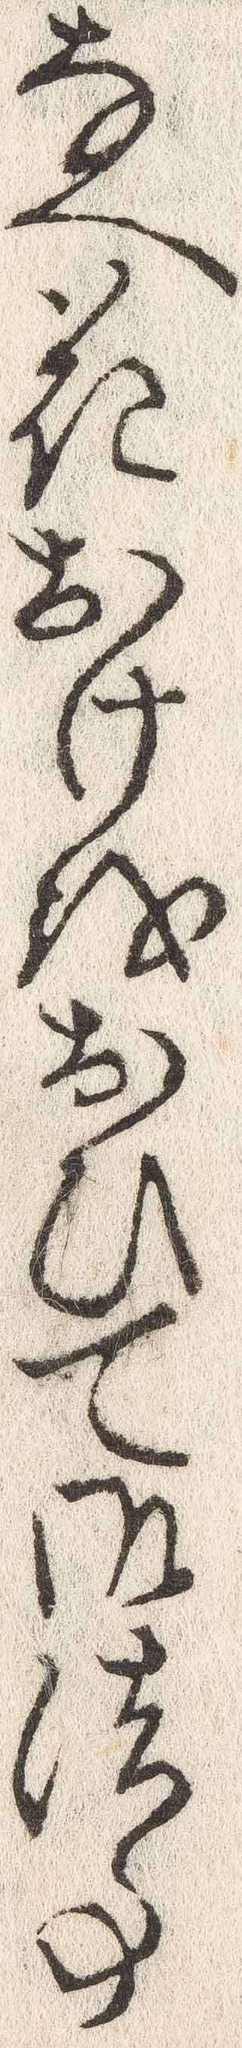なへ花おけをおひて御法事
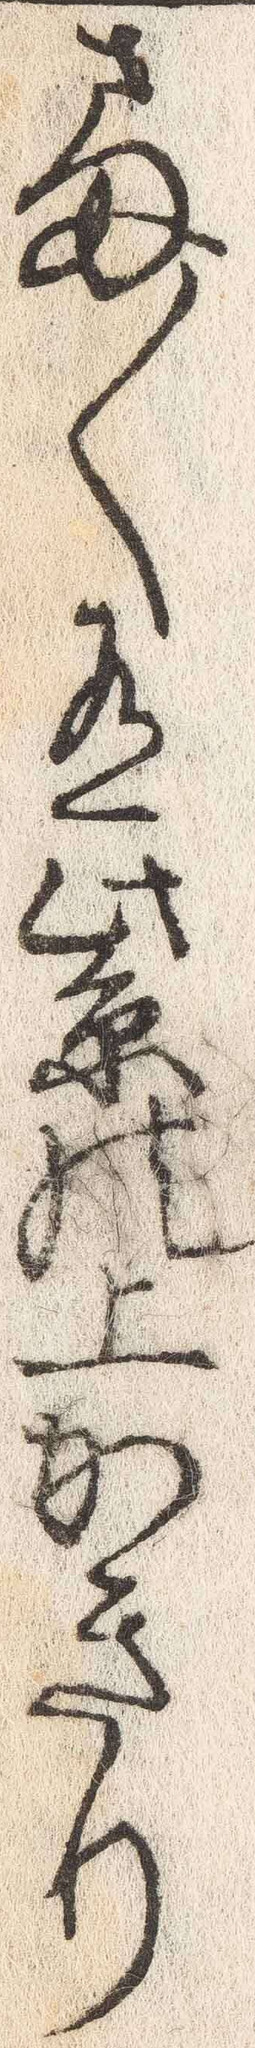さま〳〵有紫の上かきり
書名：源氏物語
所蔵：東京学芸大学附属図書館 国文学研究資料館
